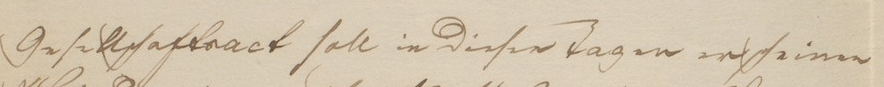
Gesellschaftsact soll in diesen Tagen erscheinen
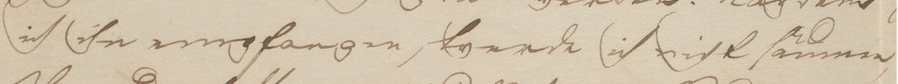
ihn empfangen, werde ich nicht säumen,
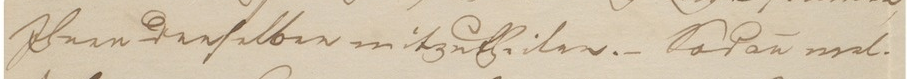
Ihnen denselben mitzutheilen. – Sodann mel-
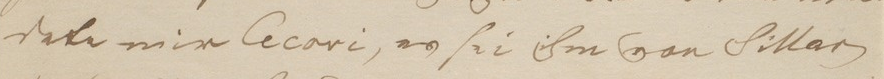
dete mir Cecovi, es sei ihm von Sillar
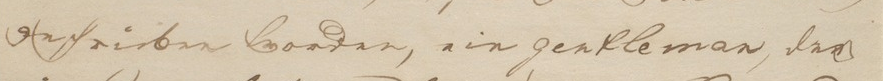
geschrieben worden, ein gentleman, der
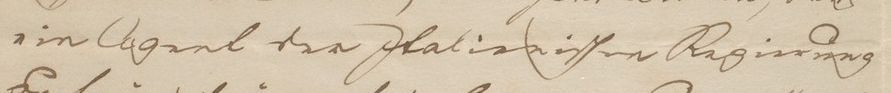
ein Agent der Italienischen Regierung
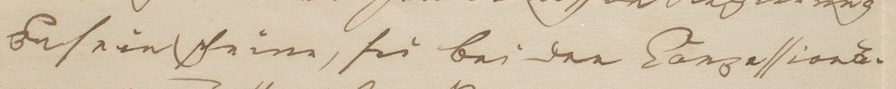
zu sein scheine, sei bei den Conzessionä-
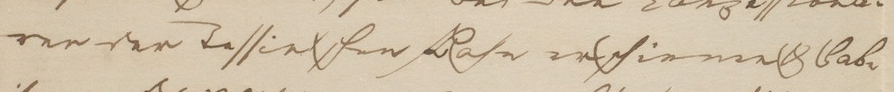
ren der Tessin'schen Bahn erschienen & habe
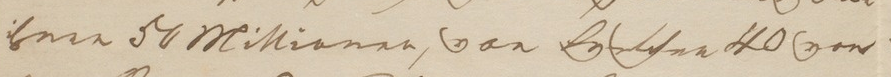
ihnen 50 Millionen, von welchen 40 von
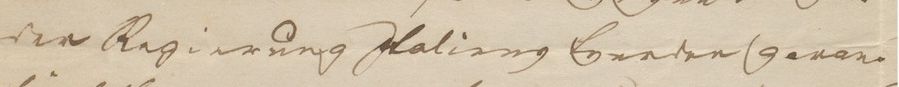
der Regierung Italiens werden garan-
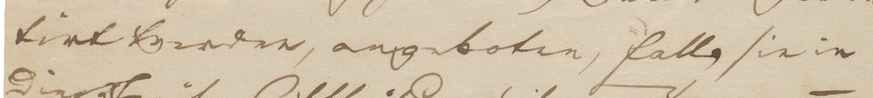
tirt werden, angeboten, falls sie in
